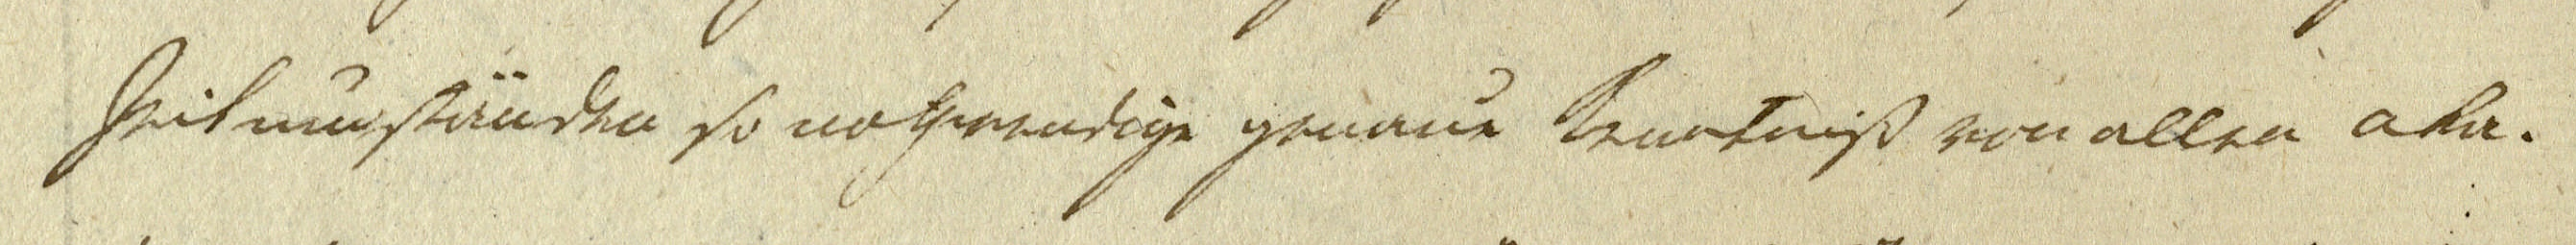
Zeitumständen so nothwendige genaue Kenntniß von allen aka¬
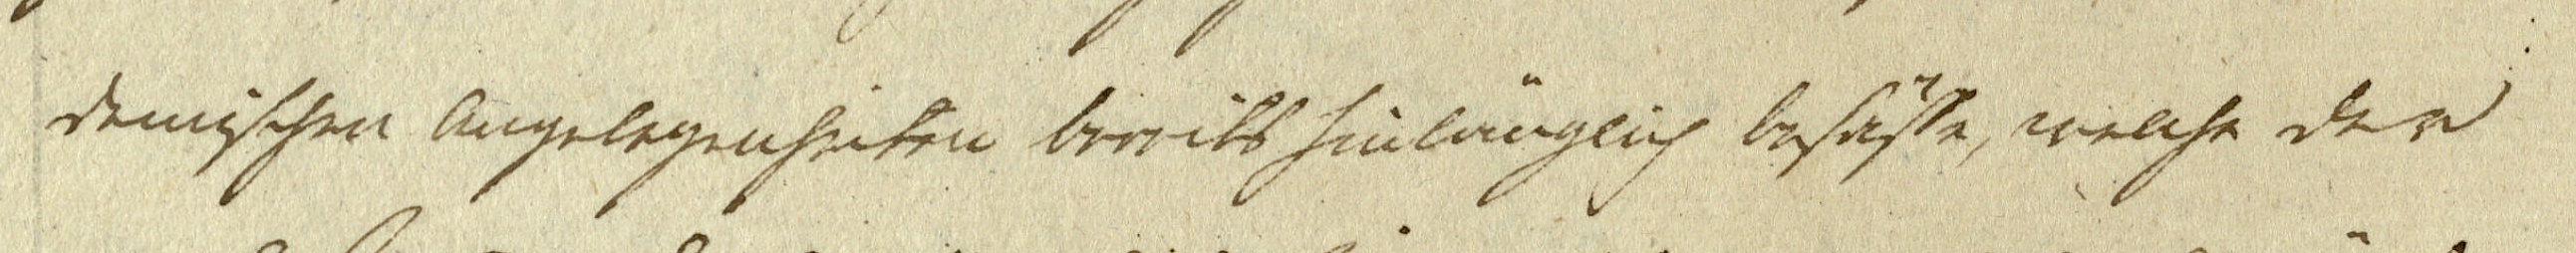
demischen Angelegenheiten bereits hinlänglich besässe, welche der
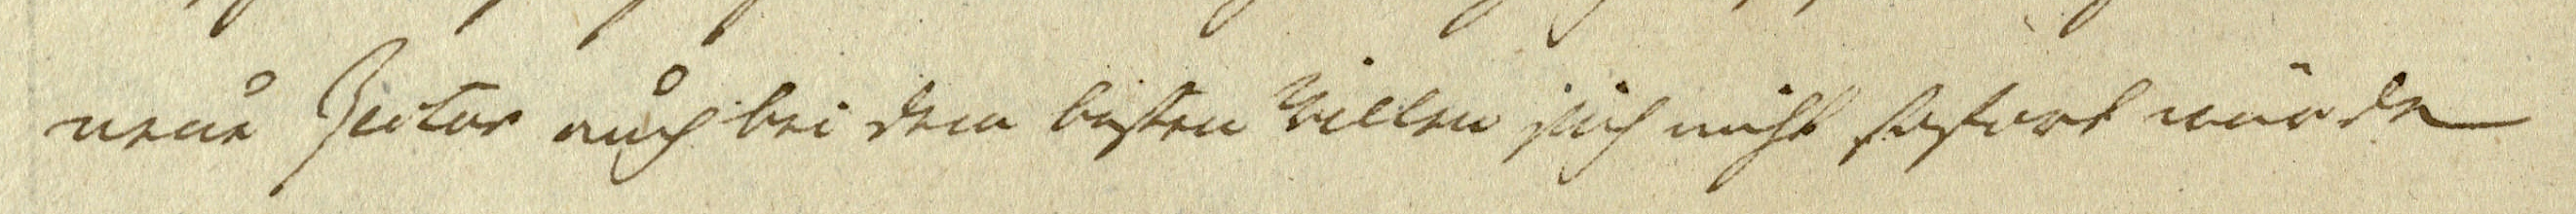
neue Rector auch bei dem besten Willen sich nicht sofort würde
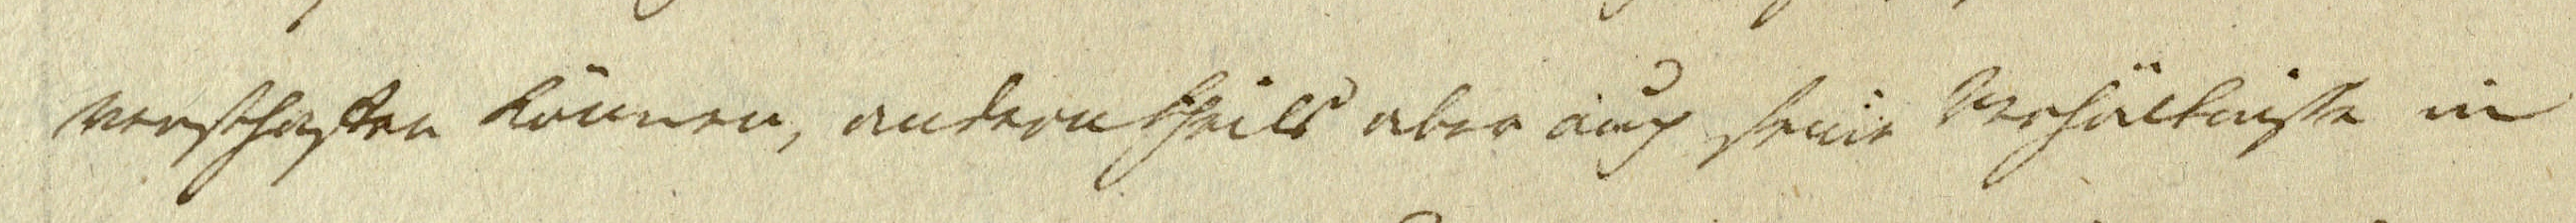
verschaffen können, andern theils aber auch seine Verhältnisse in
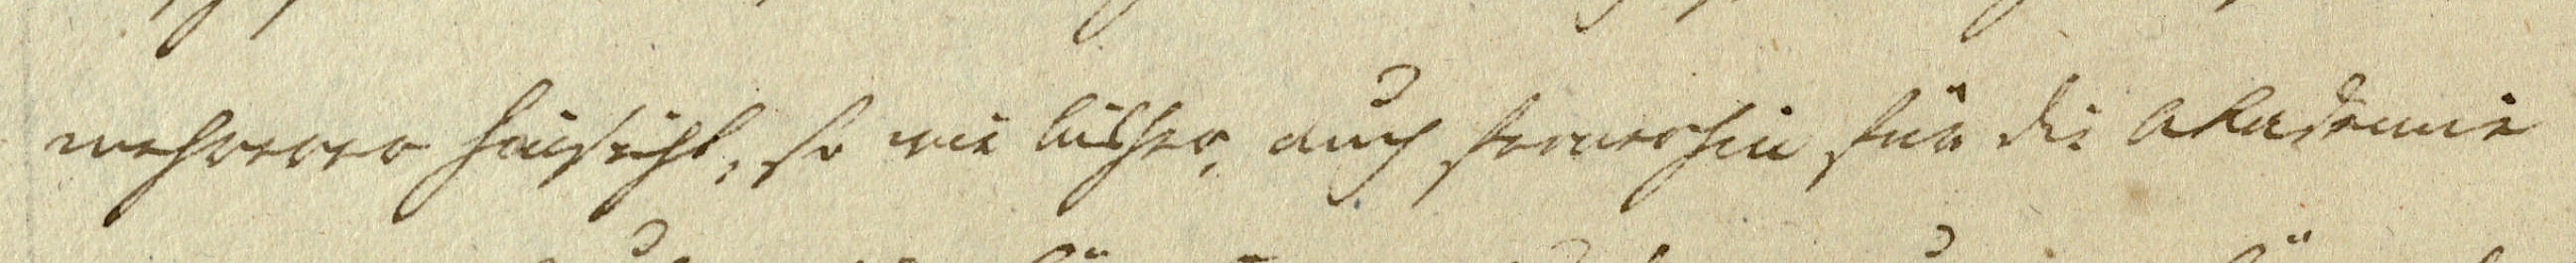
mehrerer Hinsicht; so wie bisher, auch fernerhin für die Akademie
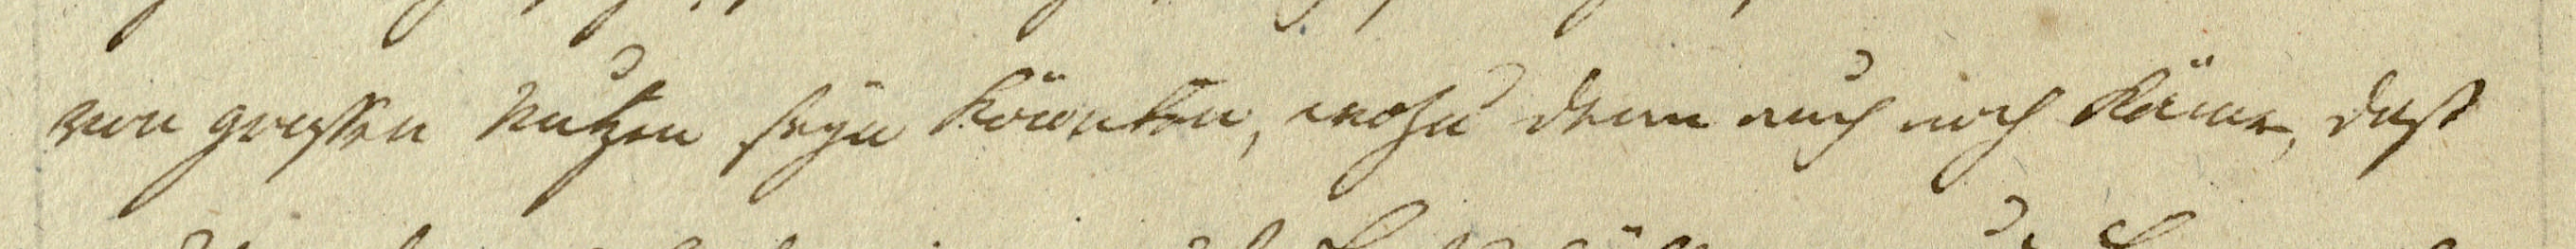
von grossen Nutzen seÿn könnten, wozu denn auch noch käme, daß
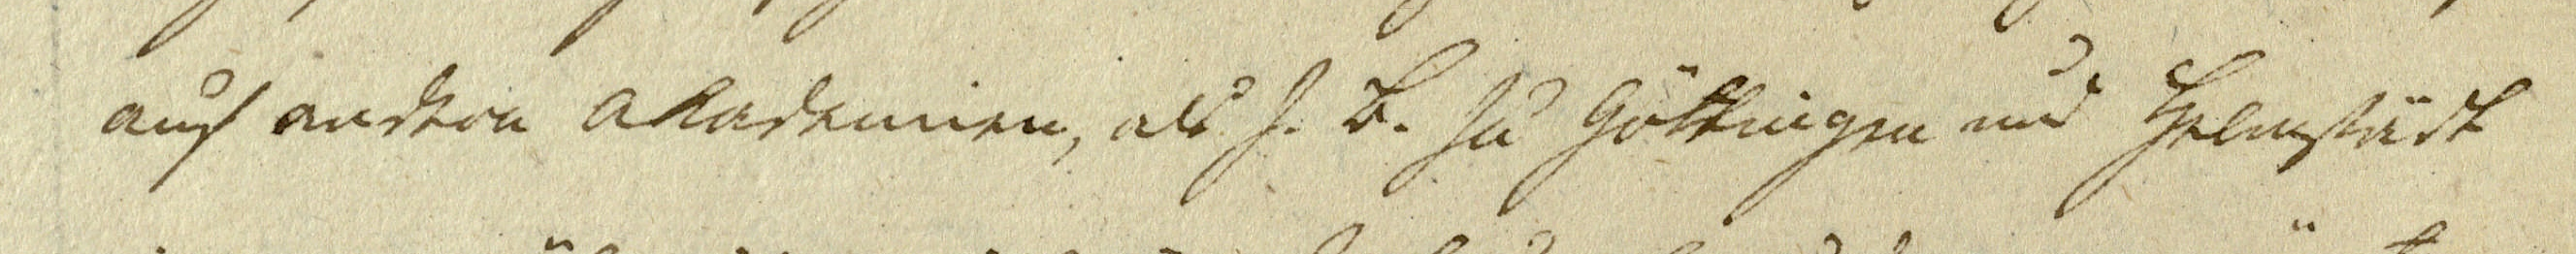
auf andern Akademien, als z. B. zu Göttingen und Helmstädt
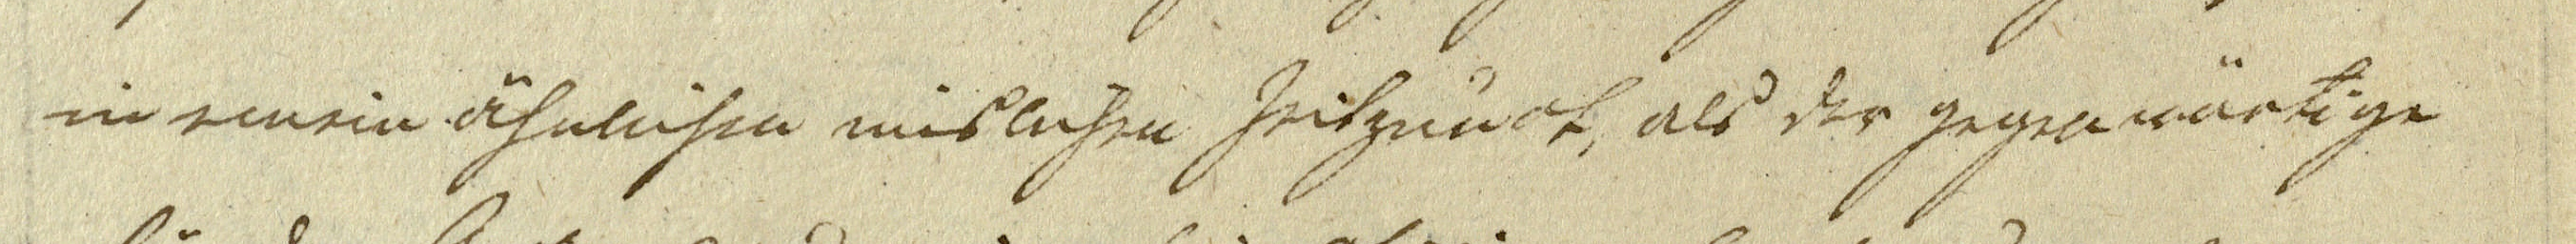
in einem ähnlichen mislichen Zeitpunct, als der gegenwärtige
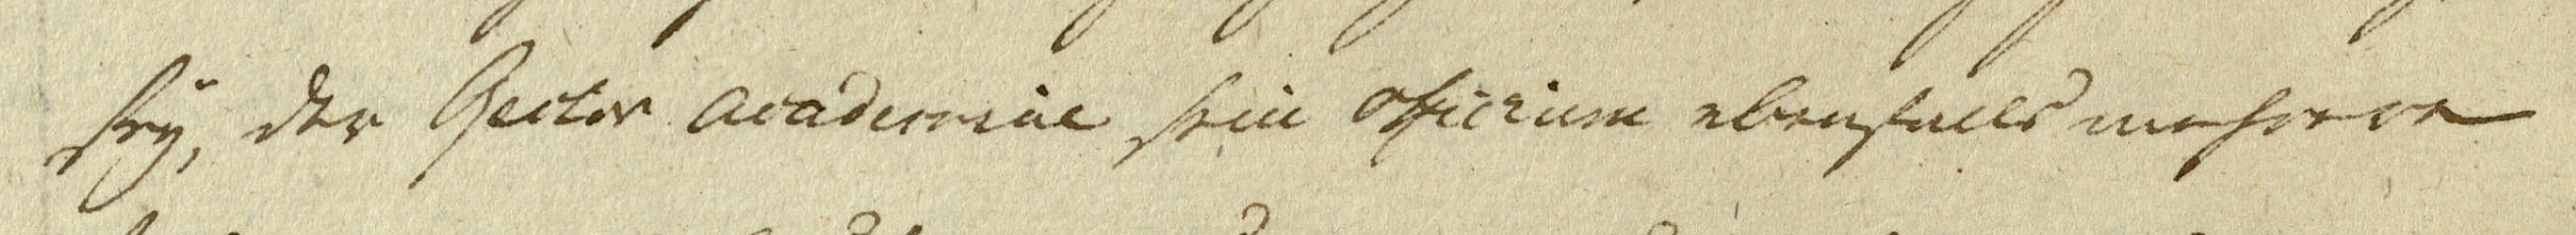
seÿ, der Rector Academie sein officium ebenfalls mehrere
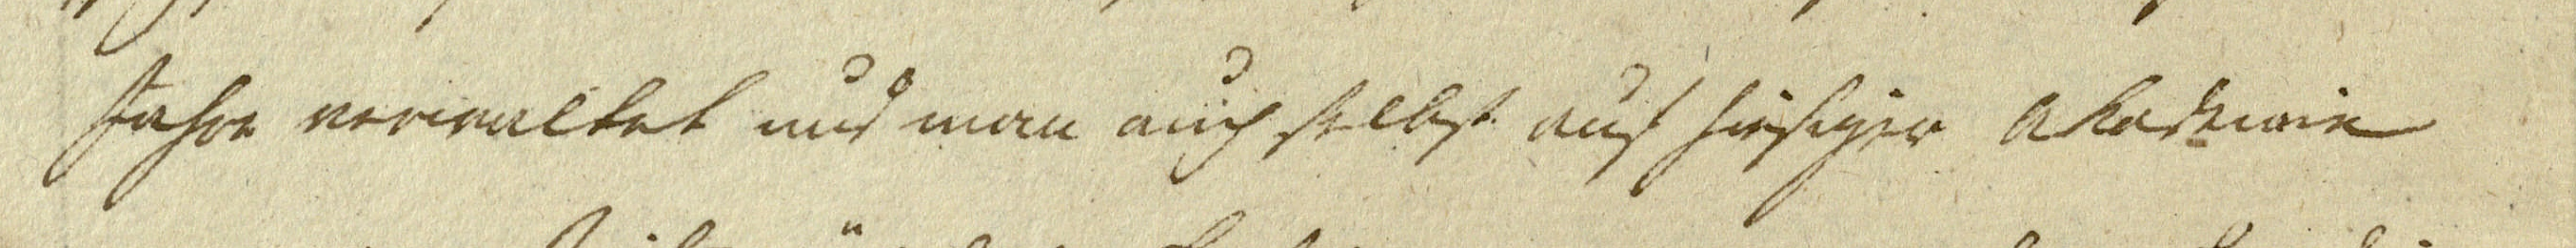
Jahre verwaltet und man auch selbst auf hiesiger Akademie
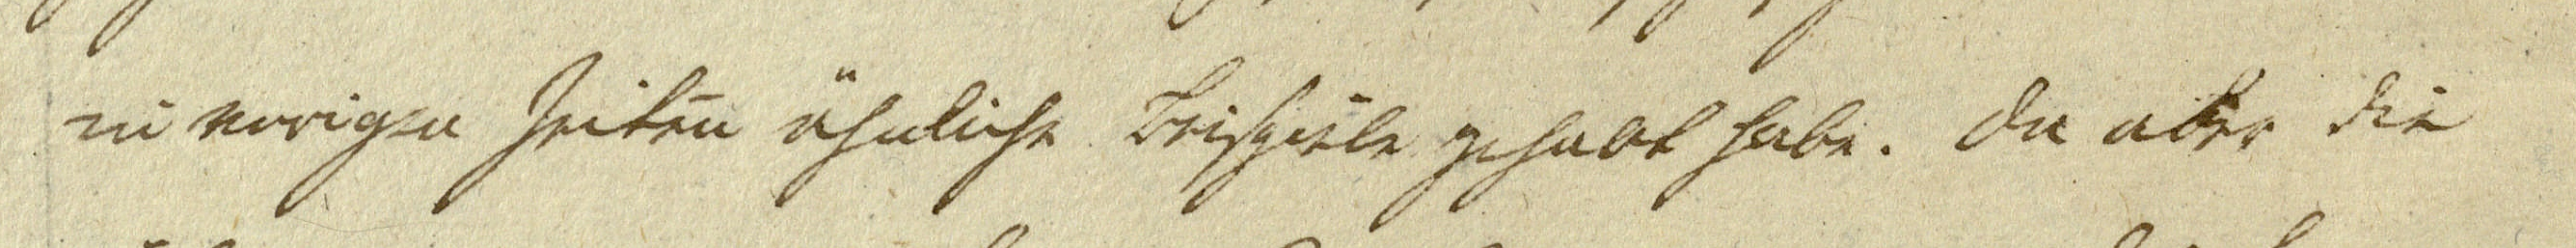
in vorigen Zeiten ähnliche Beispiele gehabt habe. Da aber die
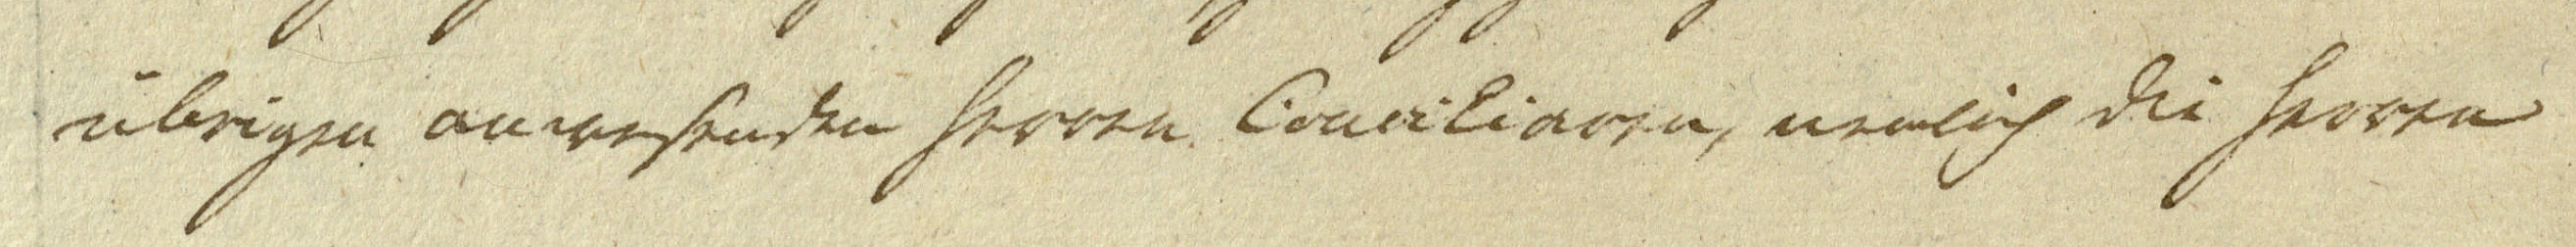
übrigen anwesenden Herren Conciliaren, nemlich die Herren
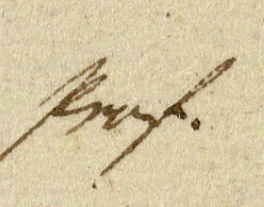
Prof.
